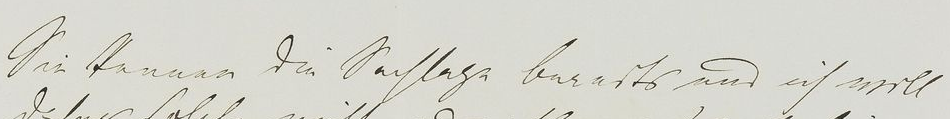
Sie kennen die Sachlage bereits und ich will
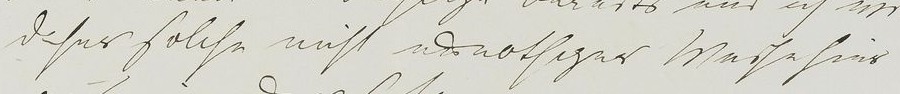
daher solche nicht unnöthiger Weise hier
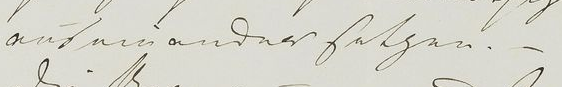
auseinander setzen. –
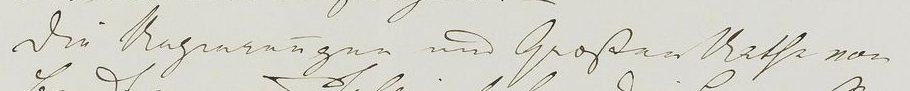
Die Regierungen und Großen Räthe von
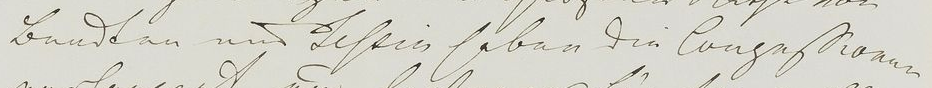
Bündten und Tessin haben die Conzessionen
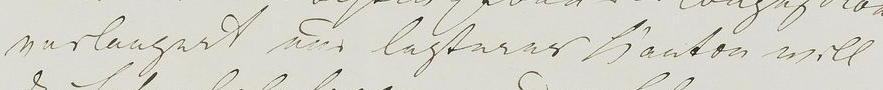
verlängert und lezterer Kanton will
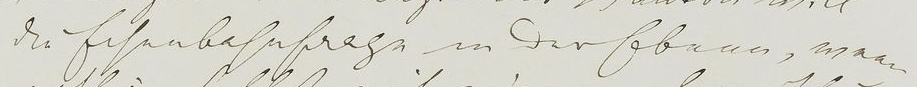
die Eisenbahnfrage in der Ebene, wenn
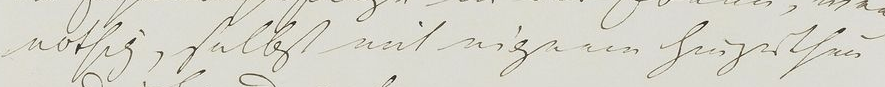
nöthig, selbst mit eignem Hinzuthun
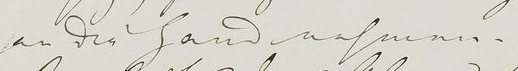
an die Hand nehmen. –
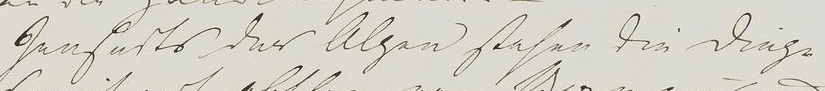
Jenseits der Alpen stehen die Dinge
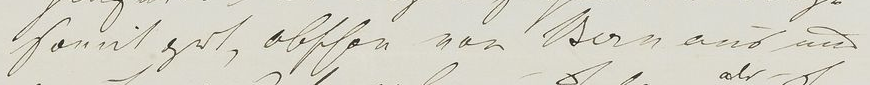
somit gut, obschon von Bern aus und
